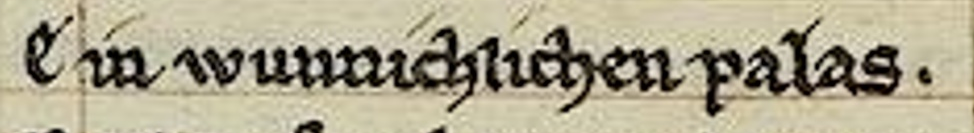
Ein wunnichlichen palas.
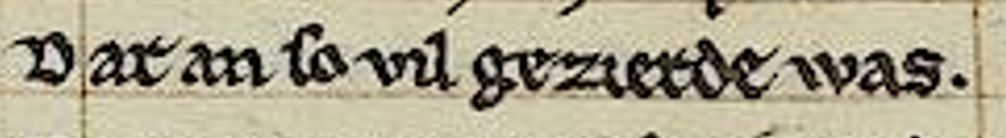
Dar an ſo vil gezierde was.
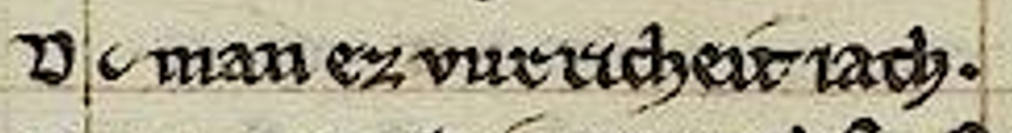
D(az) man ez vur richeit iach.
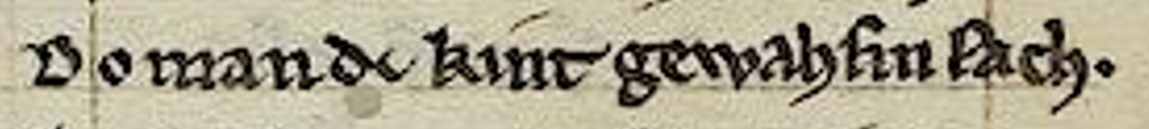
Do man d(az) kint gewahſin ſach.
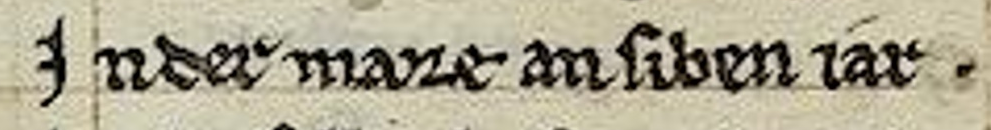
In der maze an ſiben iar.
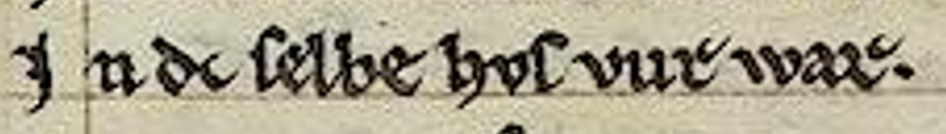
In d(az) ſelbe huſ vur war.
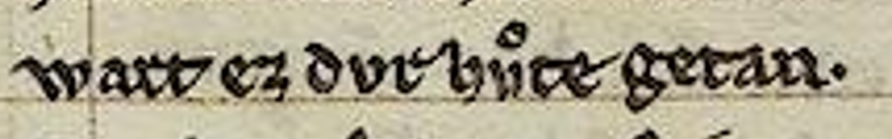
Wart ez dvr hv°ote getan.
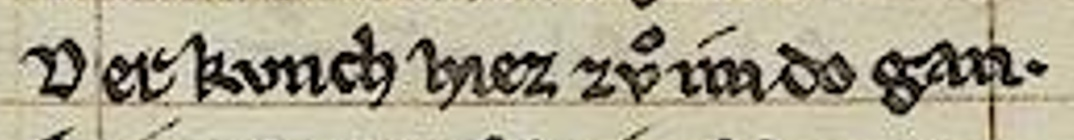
Der kvnch hiez zv°o im do gan.
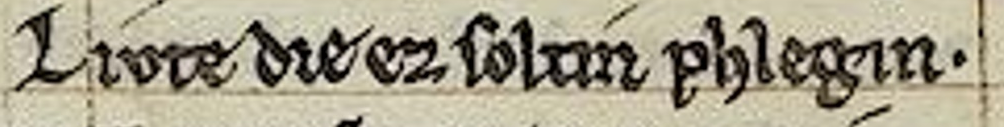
Livte die ez ſoltin phlegin.
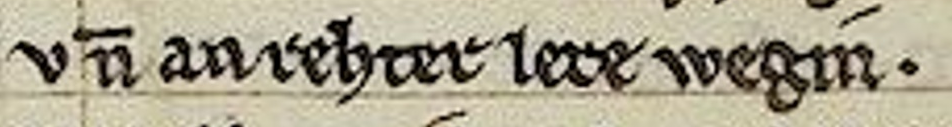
Vn(d) an rehter lere wegin.
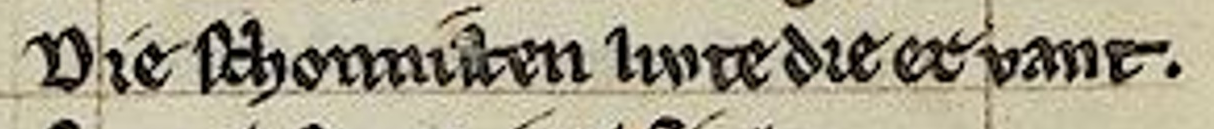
Die ſchonniſten livte die er vant.
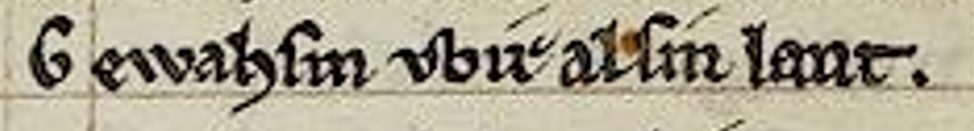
Gewahſin vbir al ſin lant.
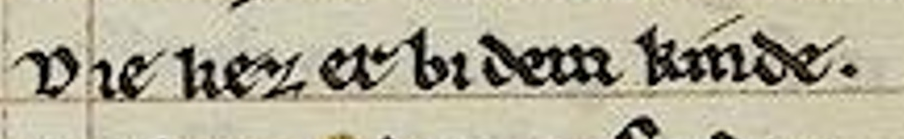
Die liez er bi dem kinde.
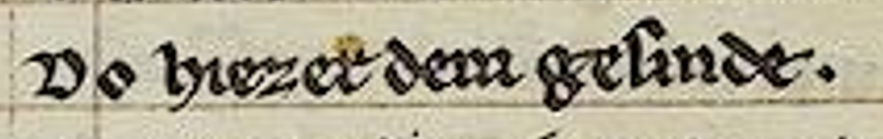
Do hiez er dem geſinde.
